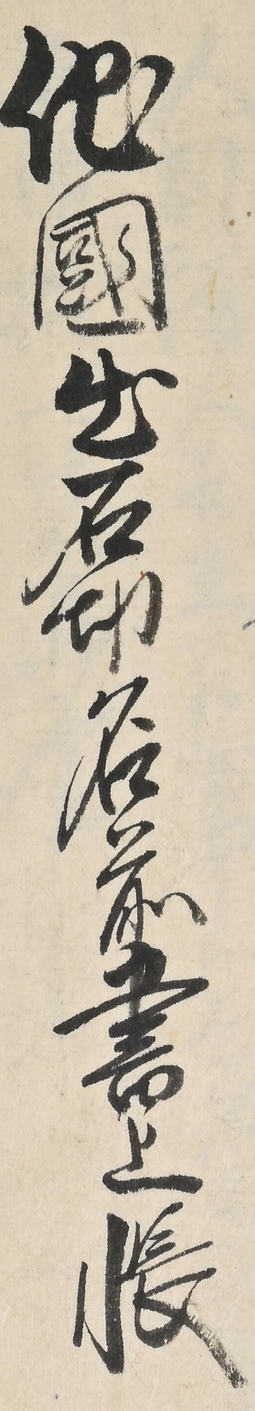他国出石切名前書上帳
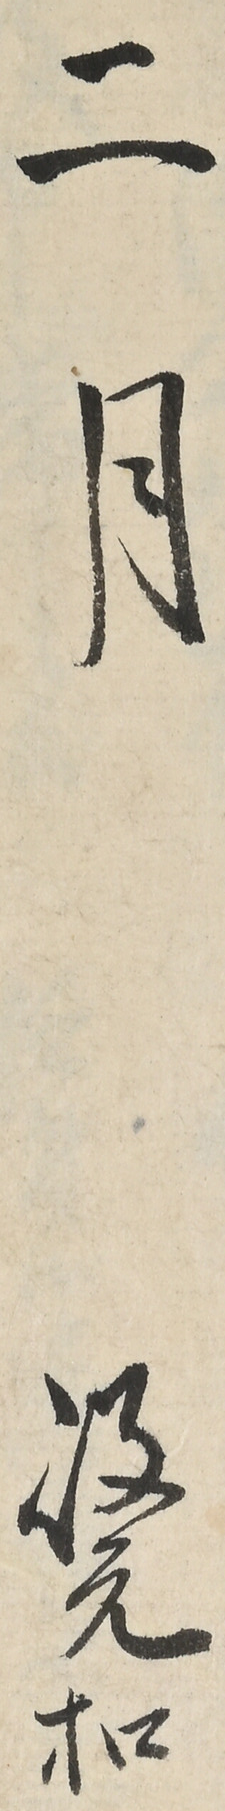二月役元扣

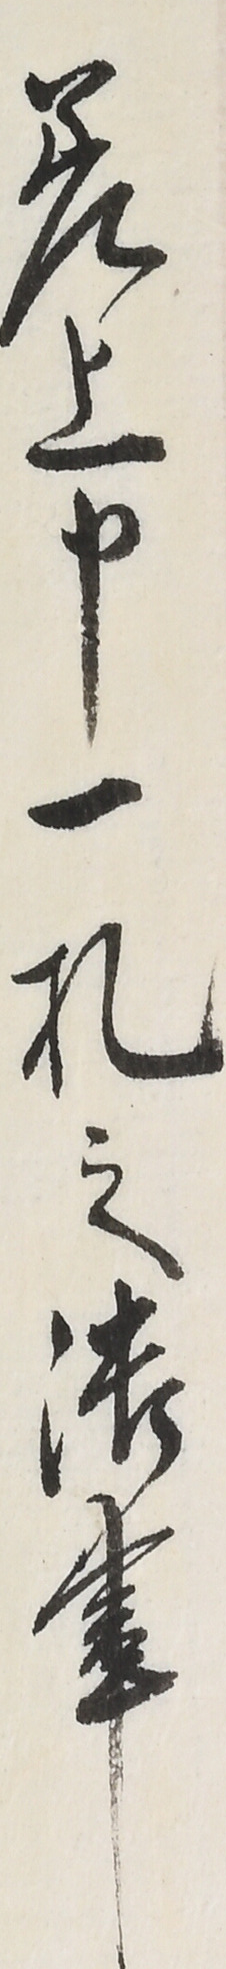差上申一札之御事
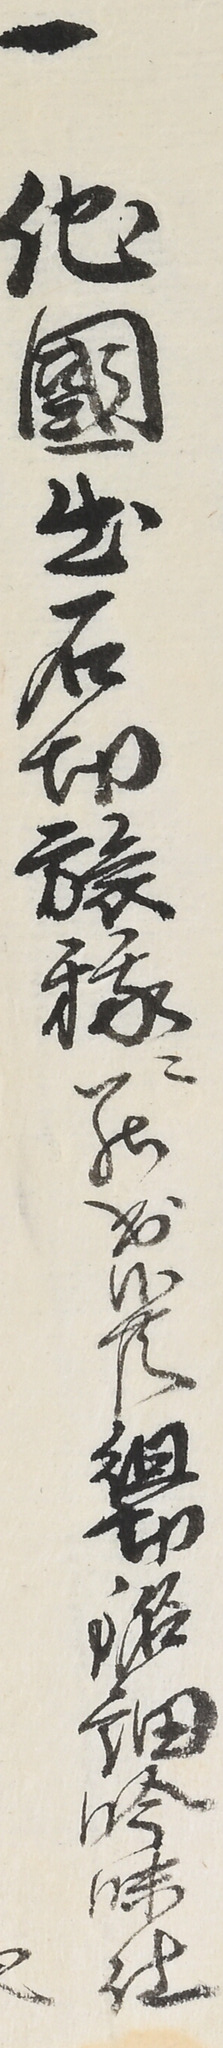一他国出石切旅稼ニ罷出候共組切銘細吟味仕
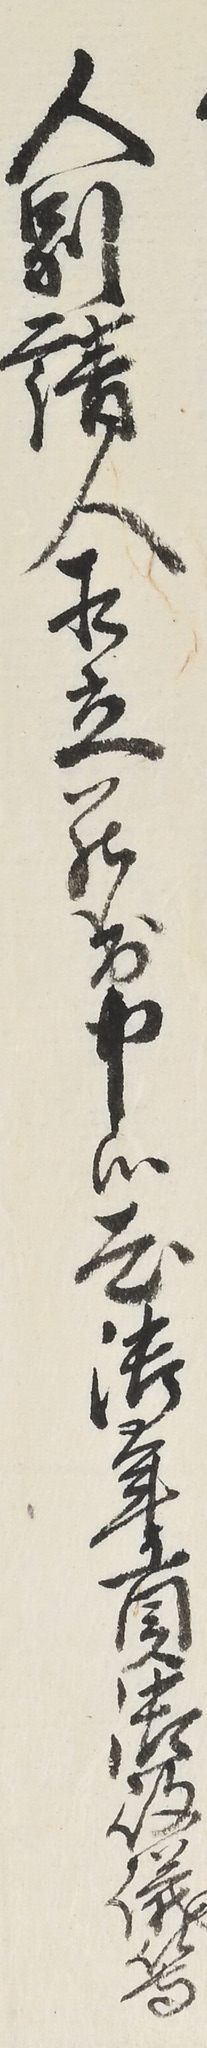人別請人相立罷出申候尤御年貢御役儀等
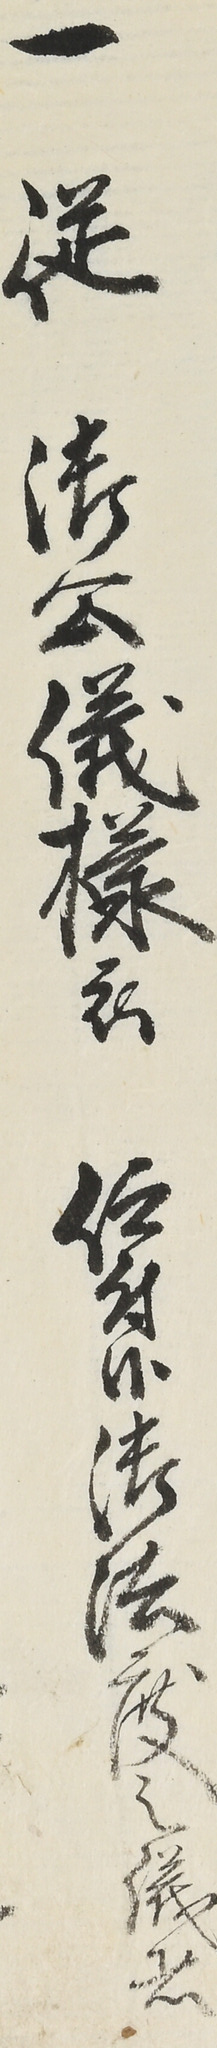一従御公儀様被仰付候御法度之儀者
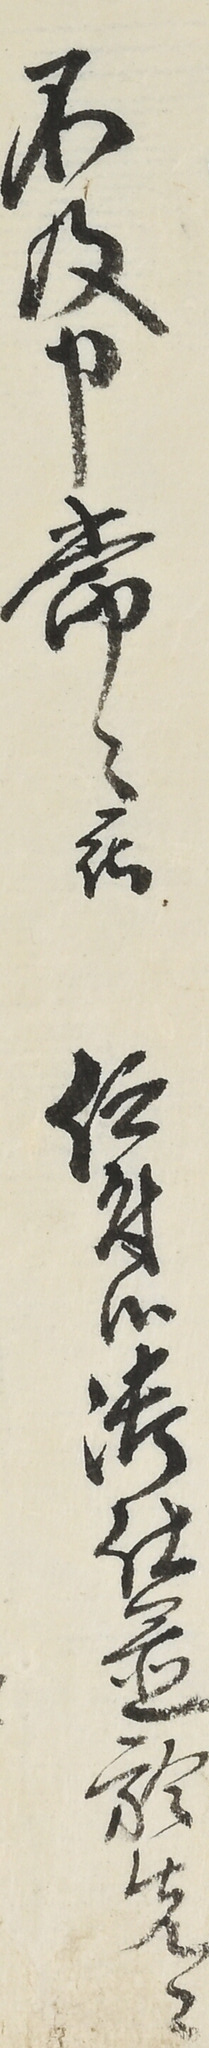不及申常々被仰付候御仕置於先々
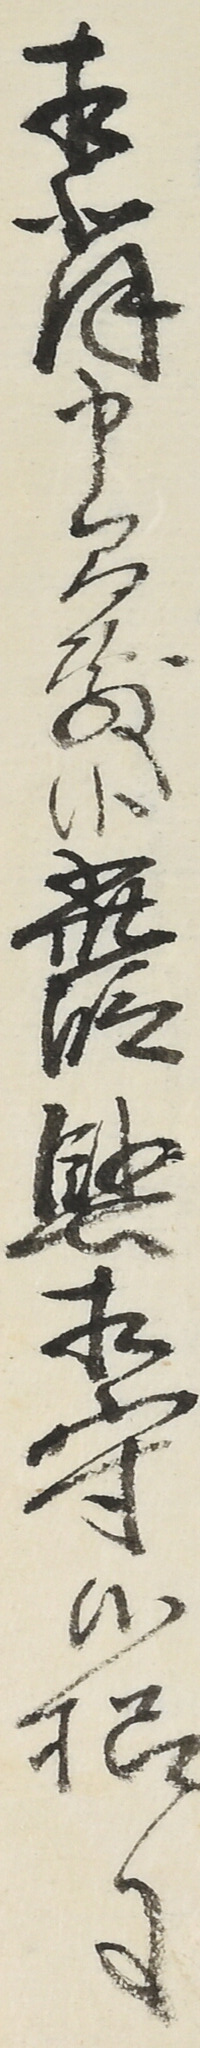相背申間敷候此段堅相守候様尓

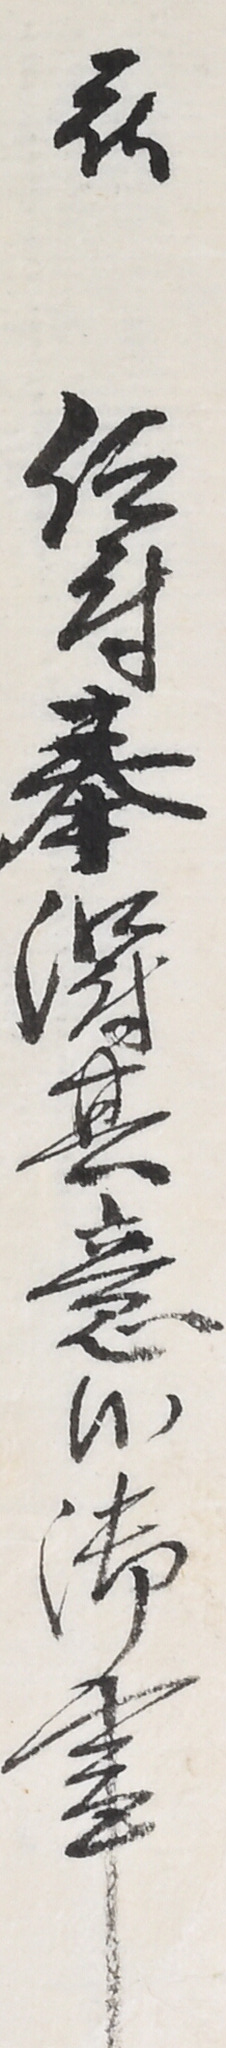被仰付奉得其意候御事
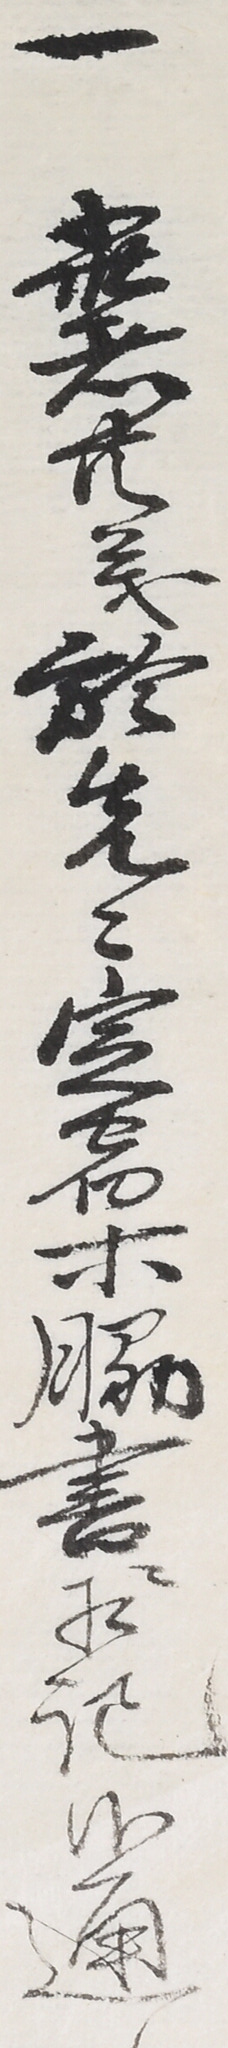一此者共義於先々定宿等脇書相記候通り
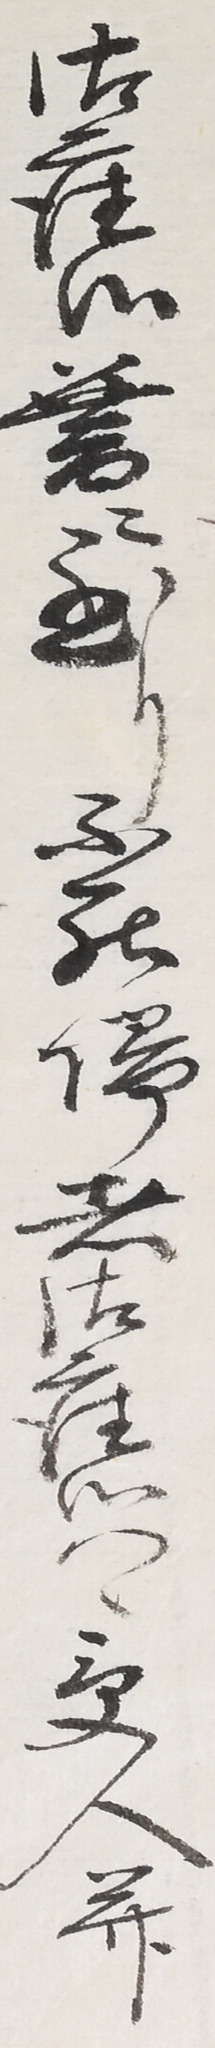御座候暮至り不罷帰者御座候ハヽ受人幷
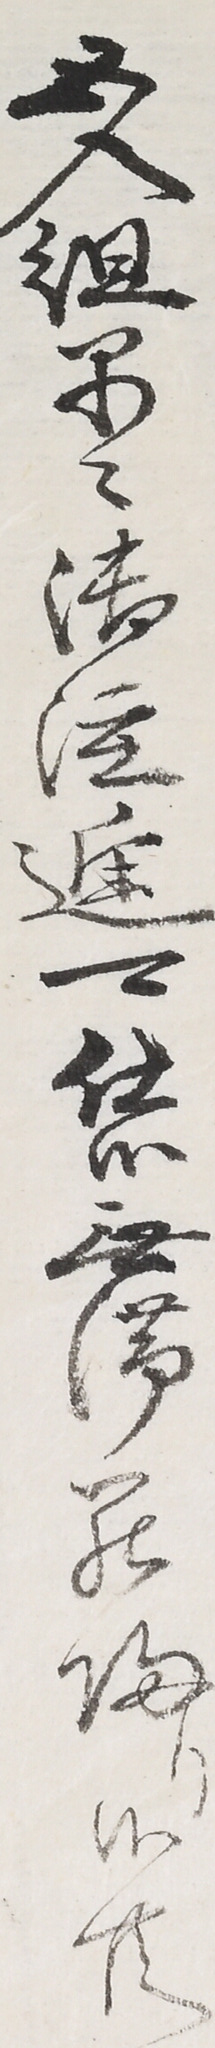五人組早々御注進可仕候無滞罷帰り候共
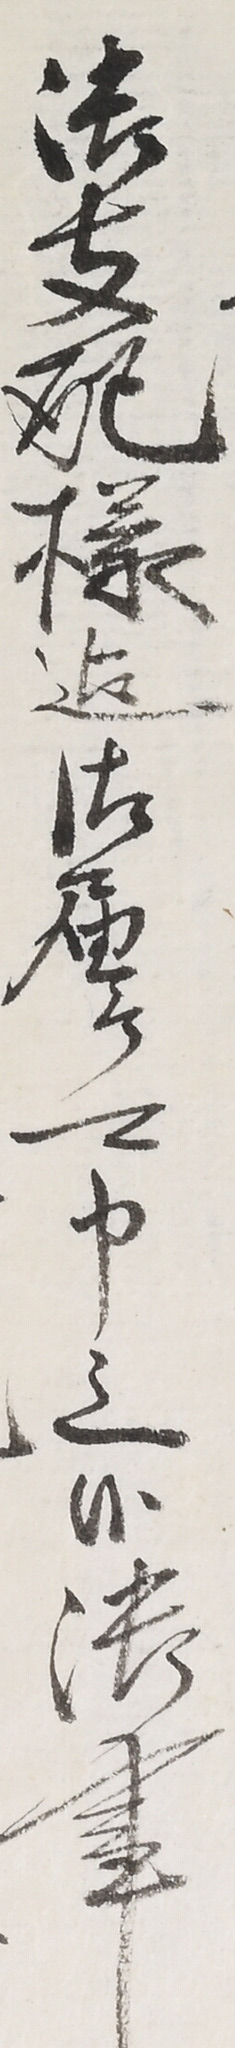御支配様迄御届可申上候御事
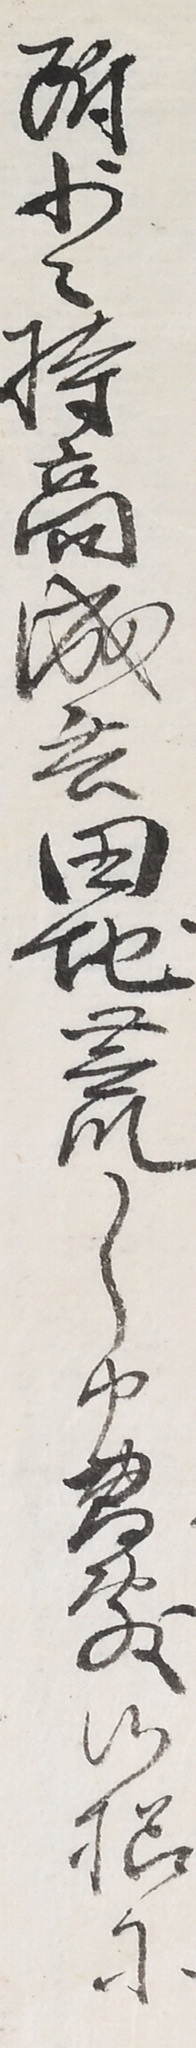附少々持高成共田地荒し申間敷候様に
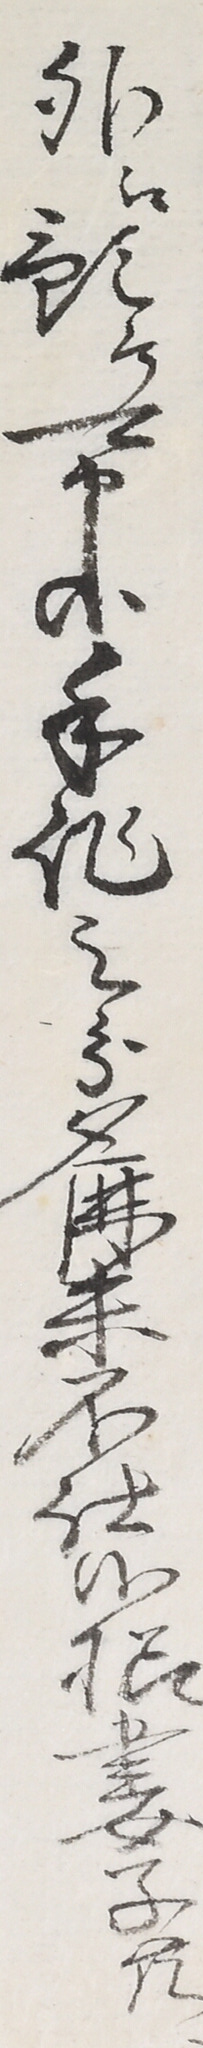外え預可申候手作之分麤末不仕候様妻子共
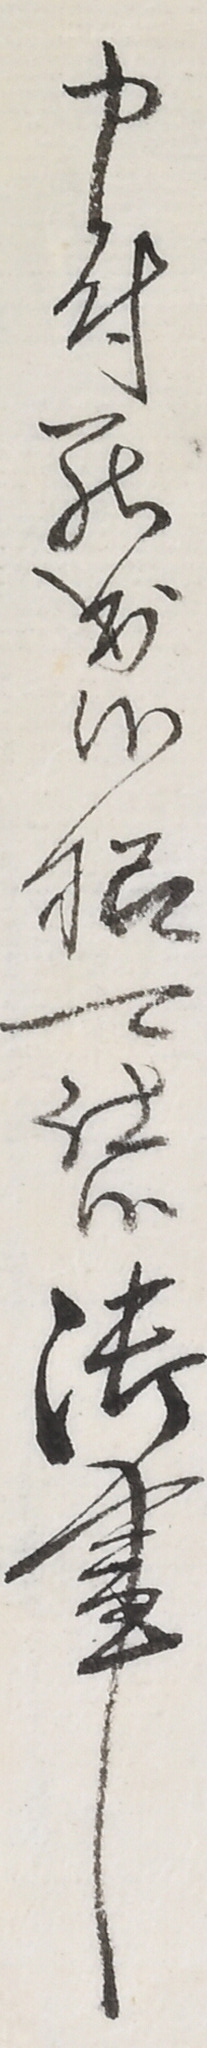申付罷出候様可仕候御事
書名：安政二乙卯年二月他國出石切名前書上帳
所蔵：伊那市立高遠町図書館・合同会社AMANE
